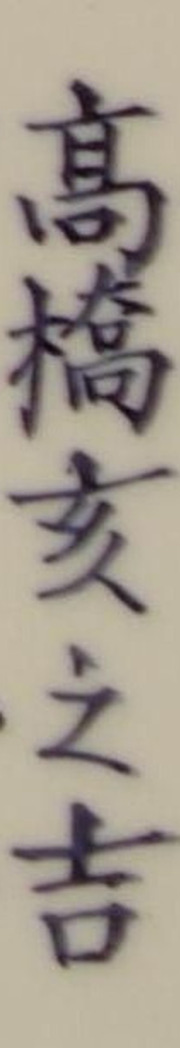高橋亥之吉
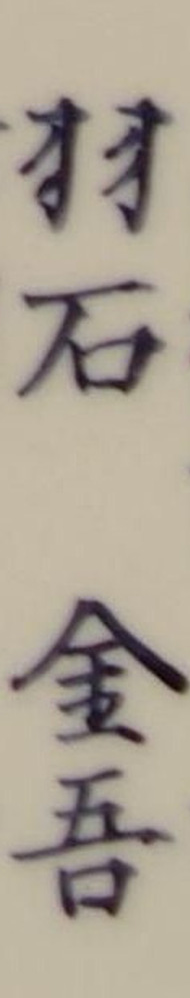羽石金吾
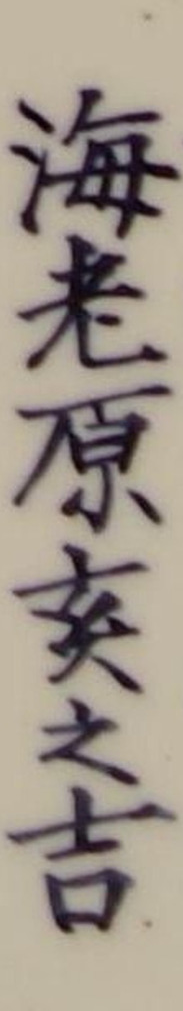海老原亥之吉
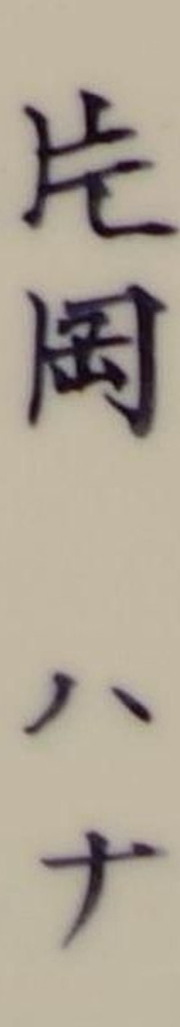片岡ハナ
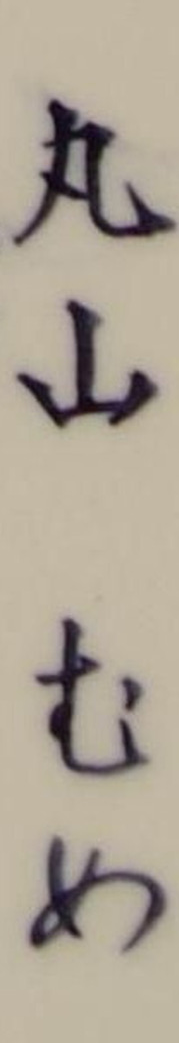丸山むめ
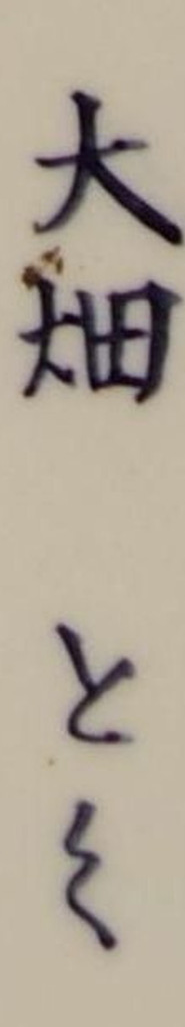大畑とく
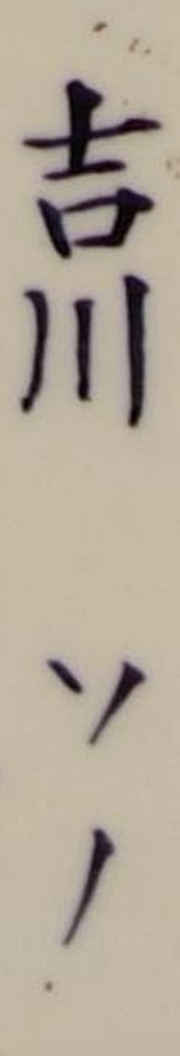吉川ソノ
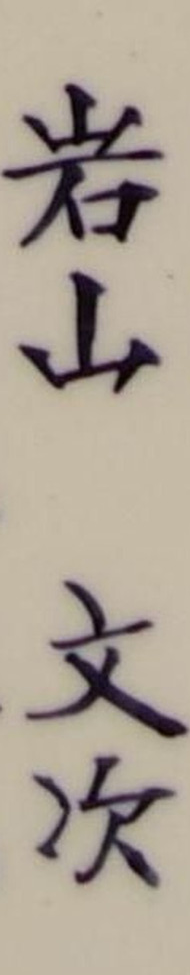岩山文次
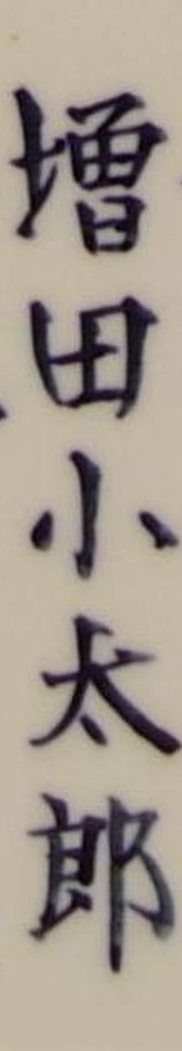増田小太郎
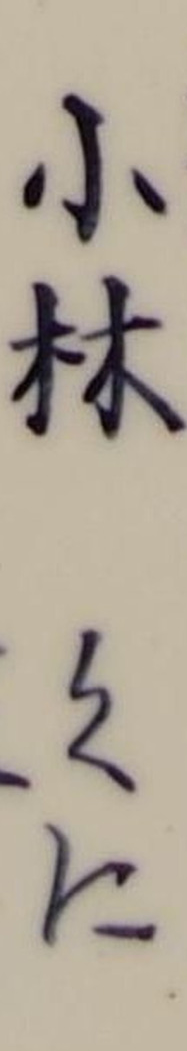小林くに
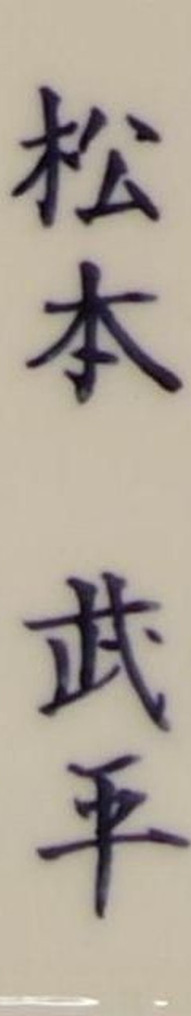松本武平

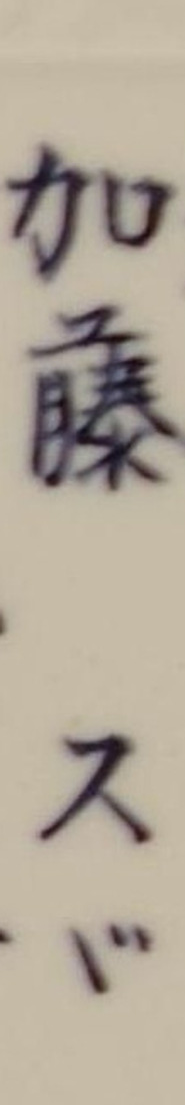加藤スゞ
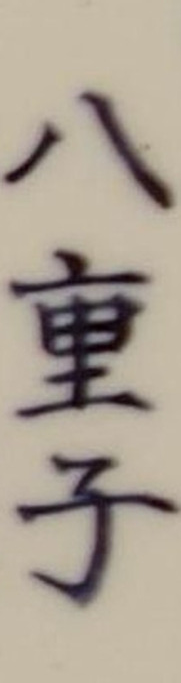八重子
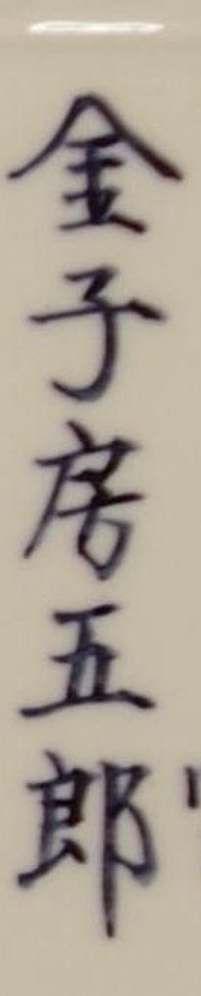金子房五郎
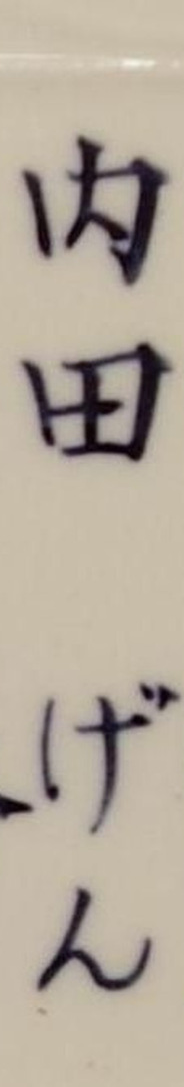内田げん
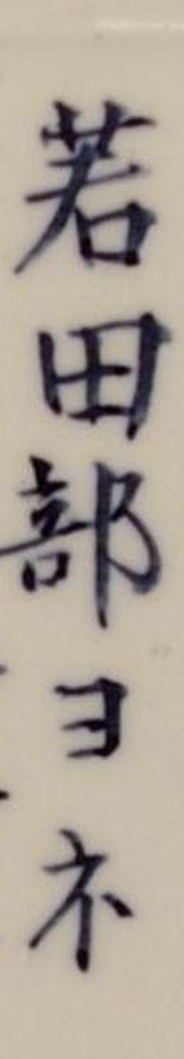若田部ヨネ
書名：M~S
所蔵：高野山金剛峯寺
